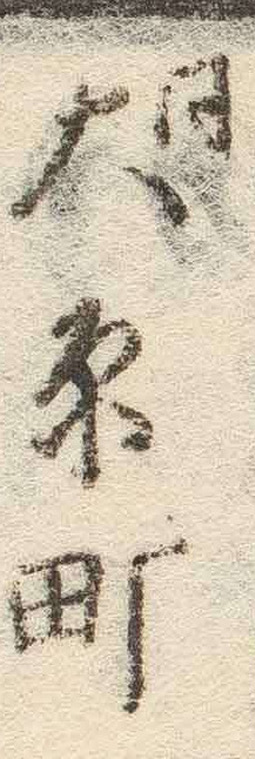大富町
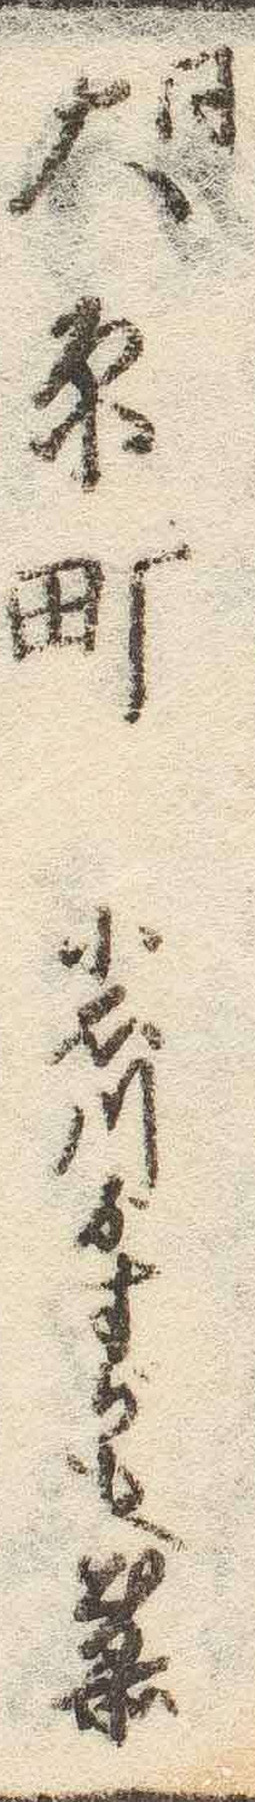大原町小石川ゟすがもへ出る所
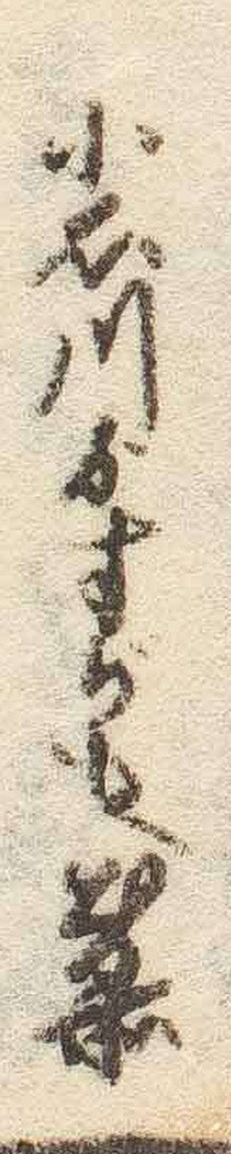大原町小石川ゟすがもへ出る所
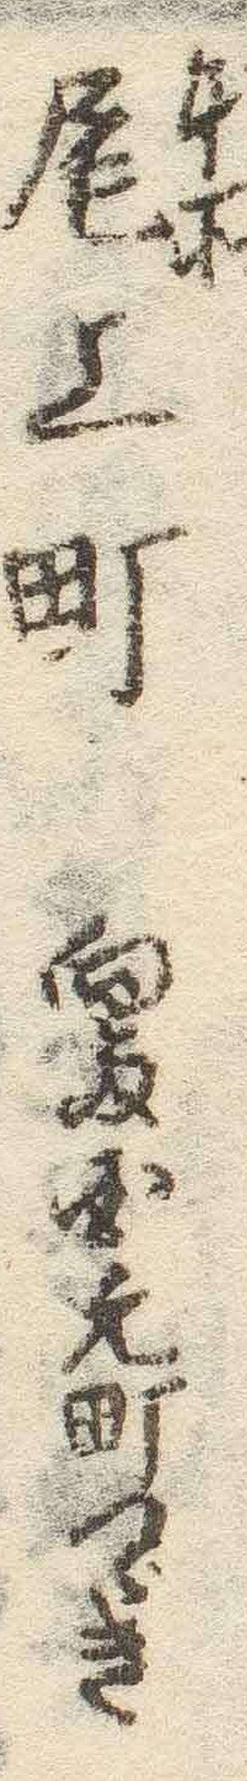尾上町向両国元町つゞき
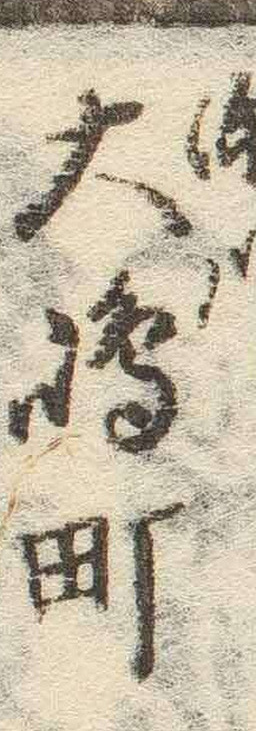大富町
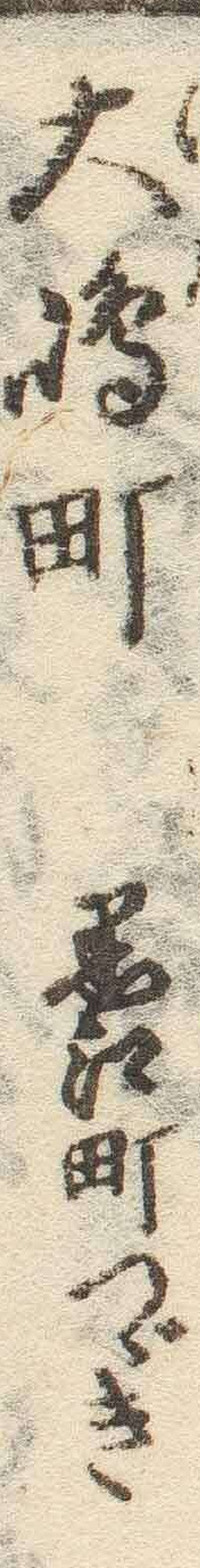大島町黒江町つゞき
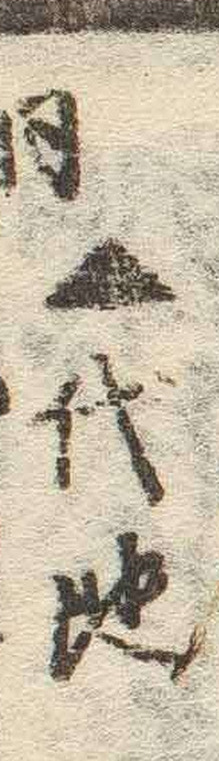▲代地
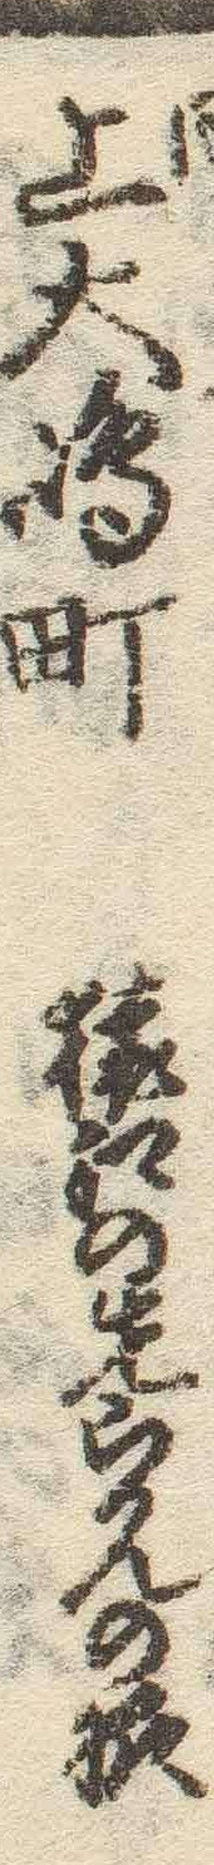上大島町猿江の先らかんの脇
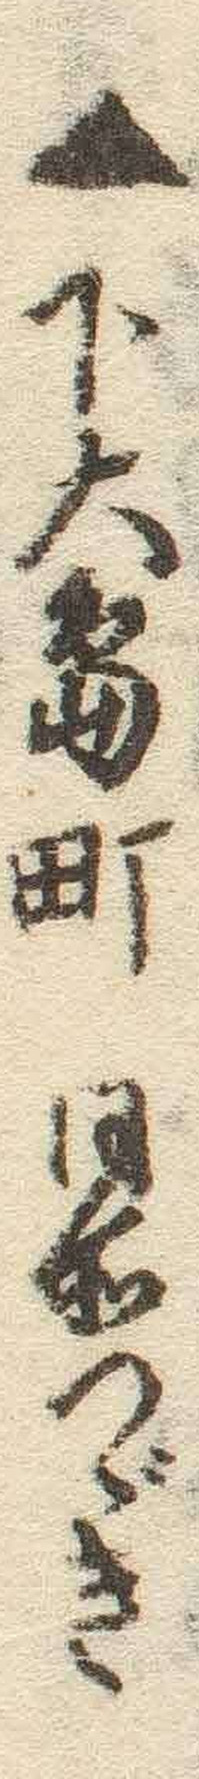▲下大島町同所つゞき
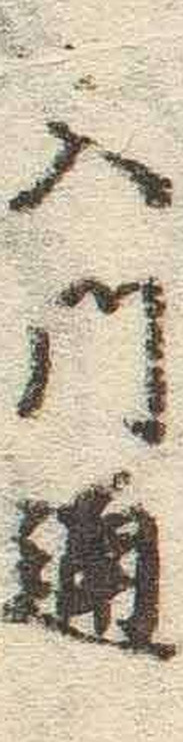大門通
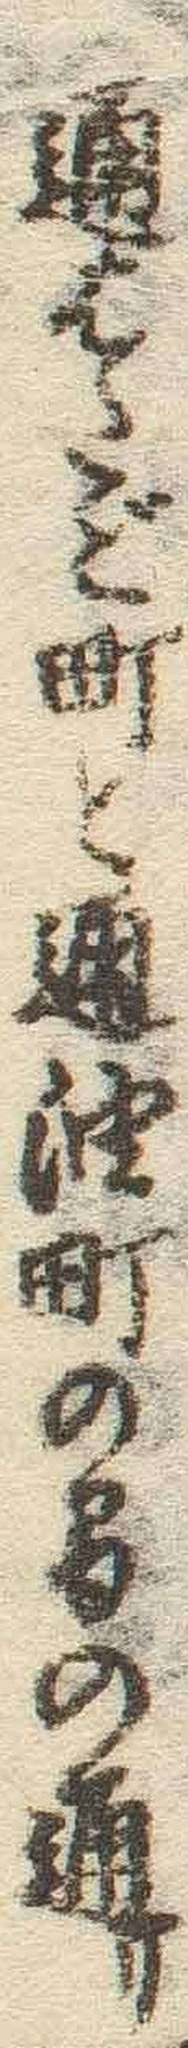通はたご町と通油町の間の通り
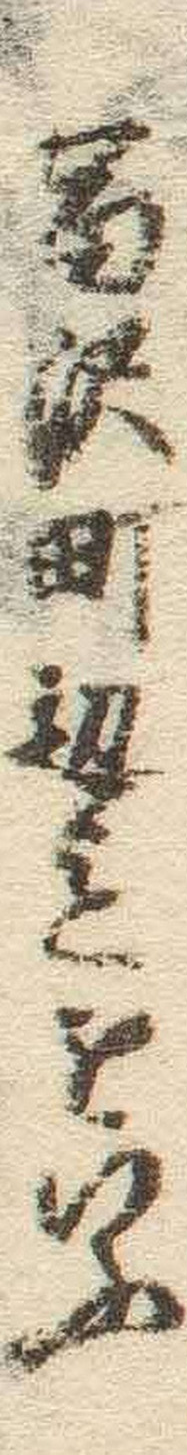富沢町辺迄をいふ
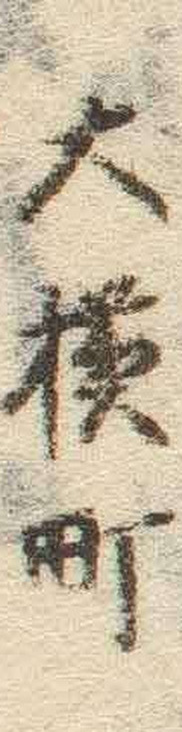大横町
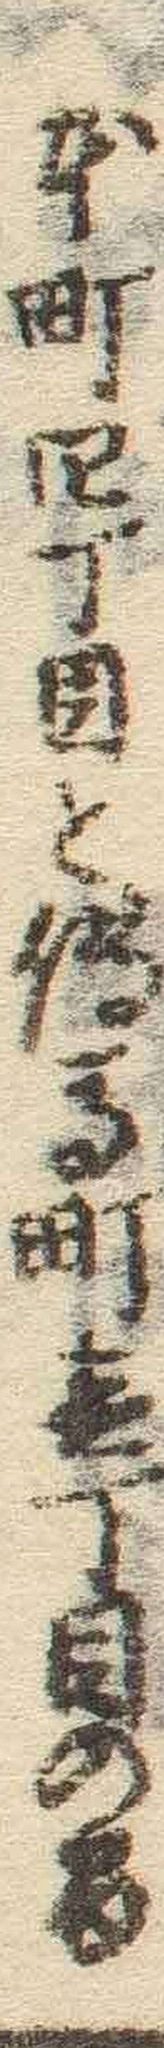本町四丁目と伝馬町壱丁目の間
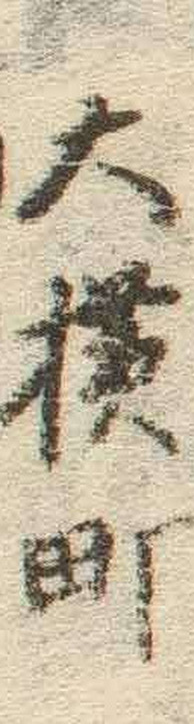大横町
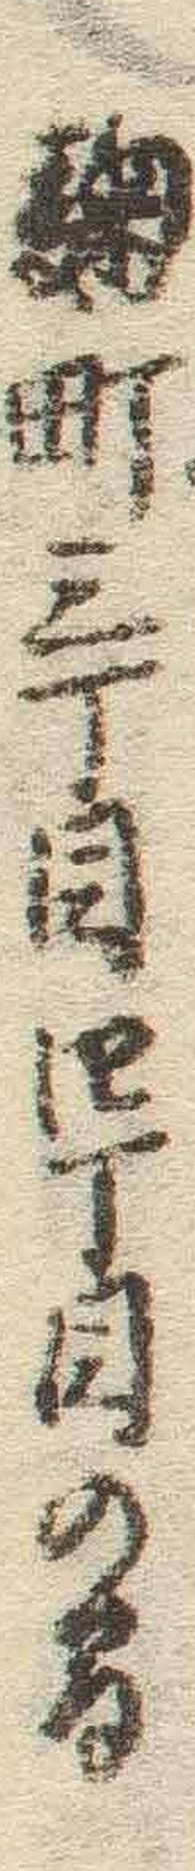麹町三丁目四丁目の間
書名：江戸町独案内
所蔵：東京学芸大学附属図書館 国文学研究資料館
